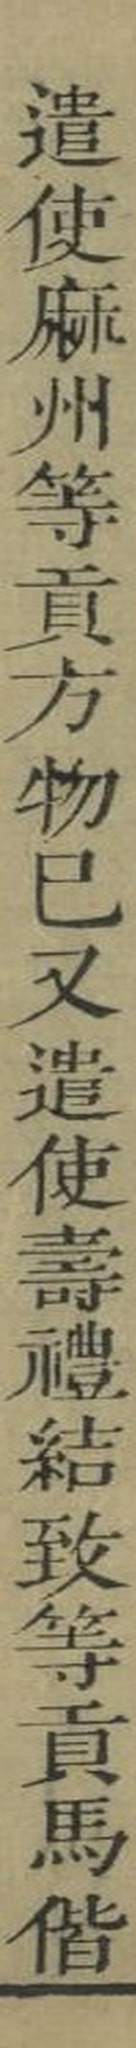遣使麻州等貢方物巳又遣使寿礼結致等貢馬偕
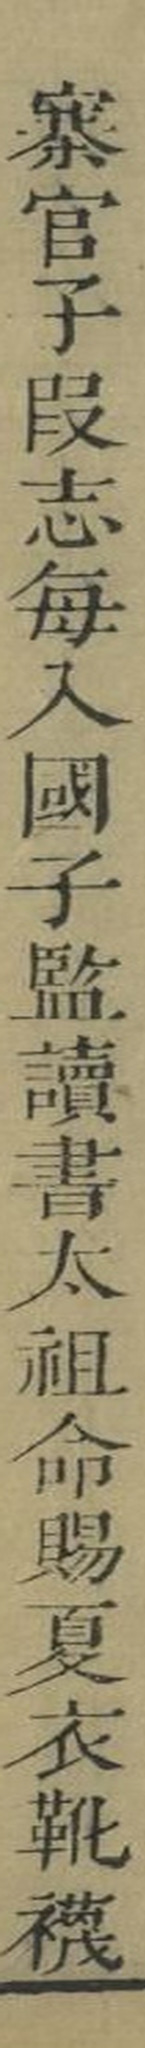寨官子叚志毎入国子監読書太祖命賜夏衣靴襪
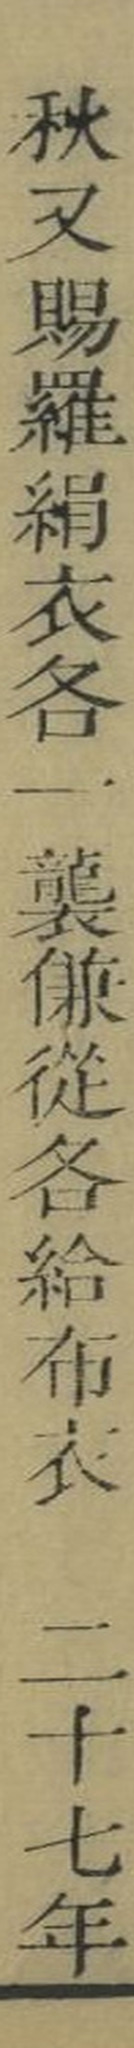秋又賜羅絹衣各一襲傔従各給布衣二十七年
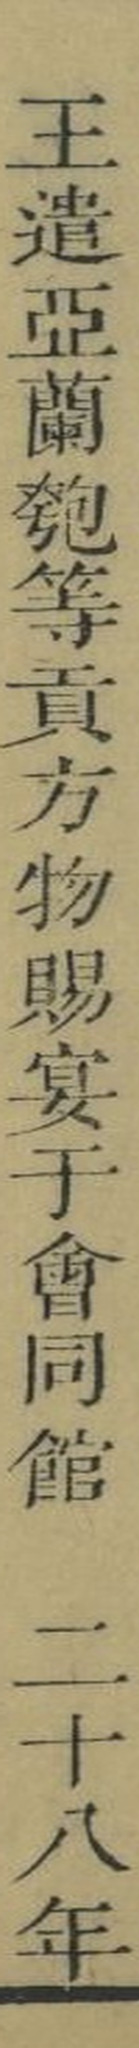王遣亜蘭匏等貢方物賜宴于会同館二十八年
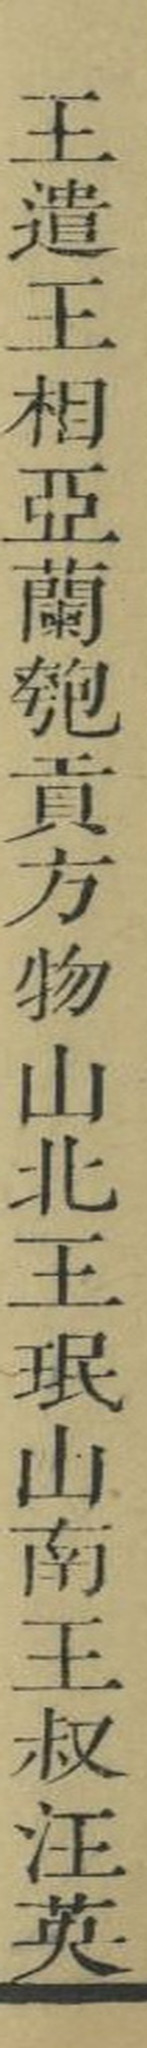王遣王相亜蘭匏貢方物山北王珉山南王叔汪英
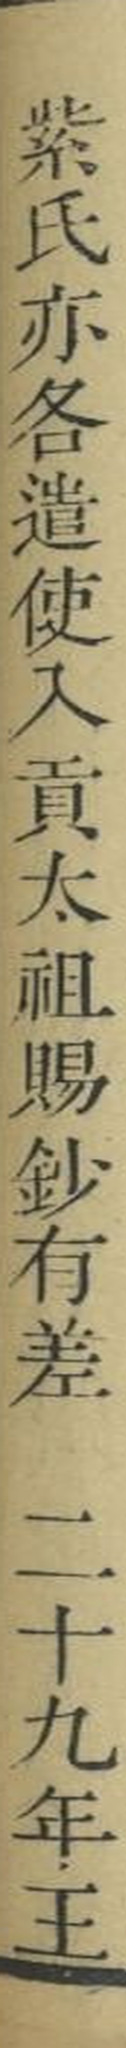紫氏亦各遣使入貢太祖賜鈔有差二十九年王
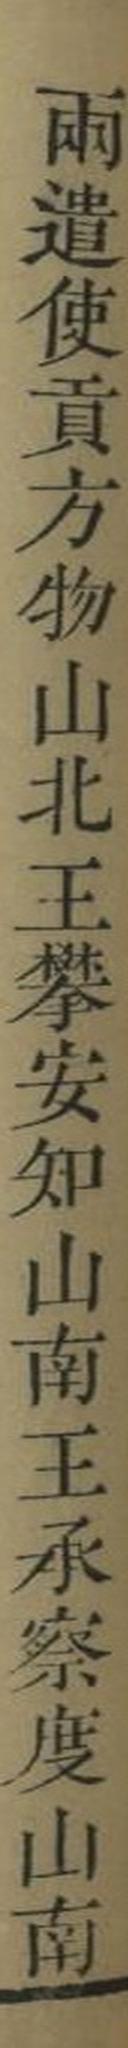両遣使貢方物山北王攀安知山南王承察度山南
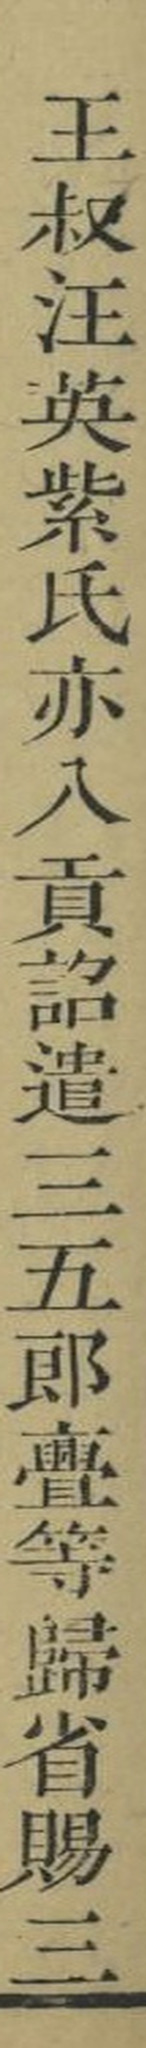王叔汪英紫氏亦入貢詔遣三五郎亹等帰省賜三
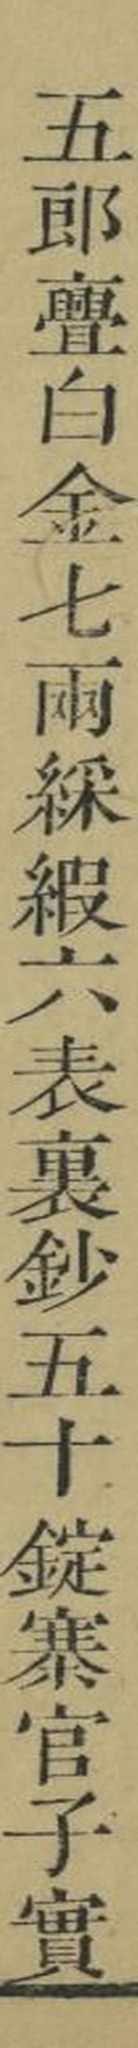五郎亹白金七両綵緞六表裏鈔五十錠寨官子実
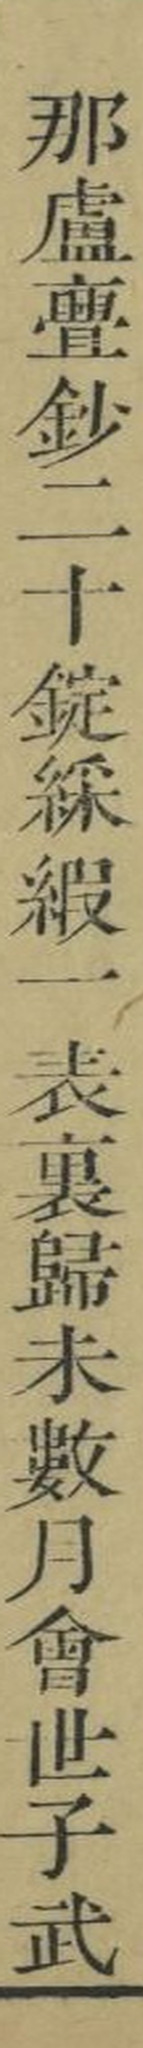那盧亹鈔二十錠綵緞一表裏帰未数月会世子武
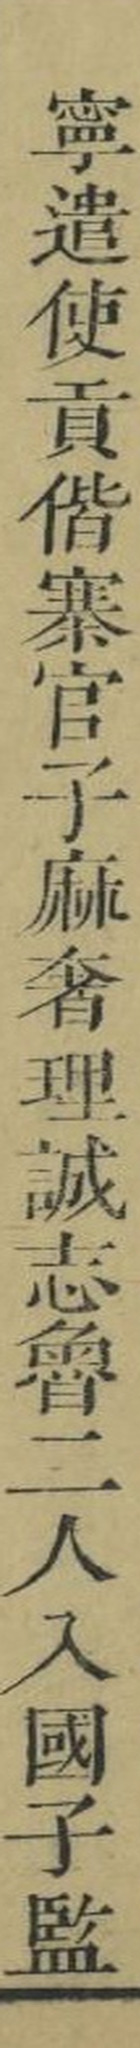寧遣使貢偕寨官子麻奢理誠志魯二人入国子監
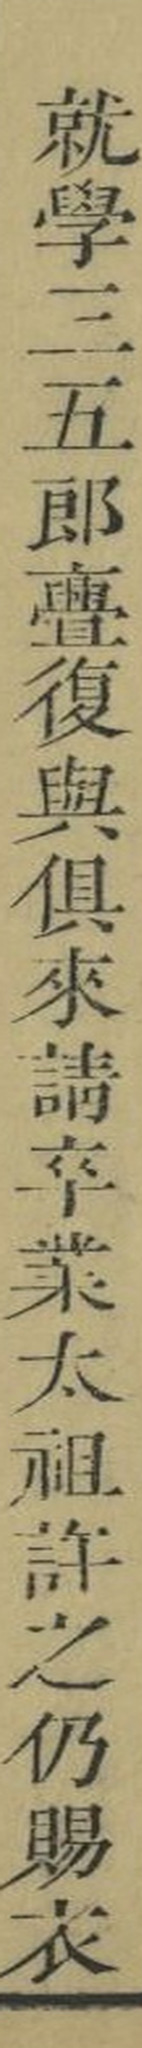就学三五郎亹復与俱来請卒業太祖許之仍賜衣
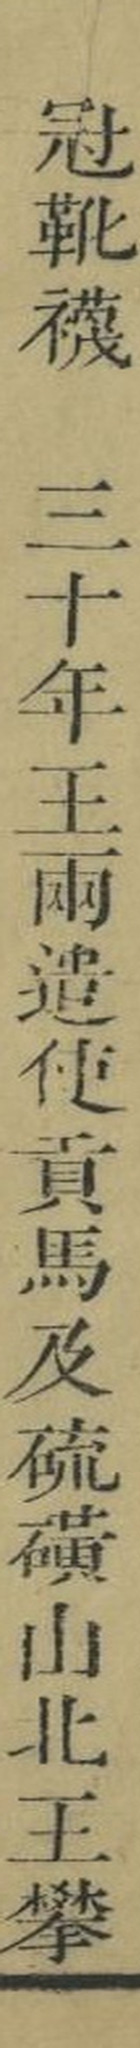冠靴襪三十年王両遣使貢馬及硫磺山北王攀
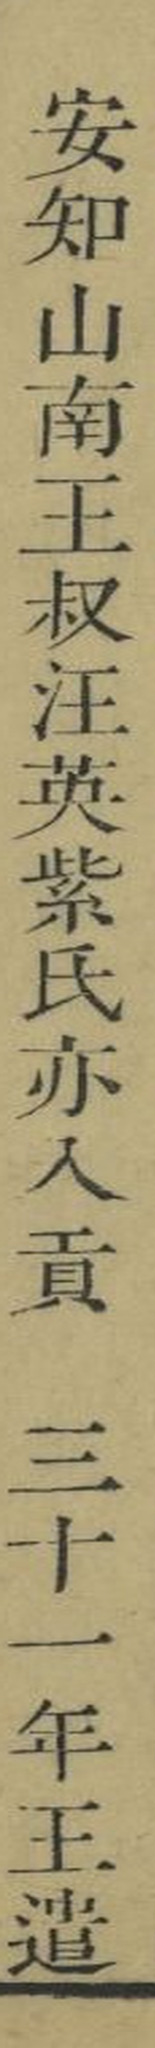安知山南王叔汪英紫氏亦入貢三十一年王遣
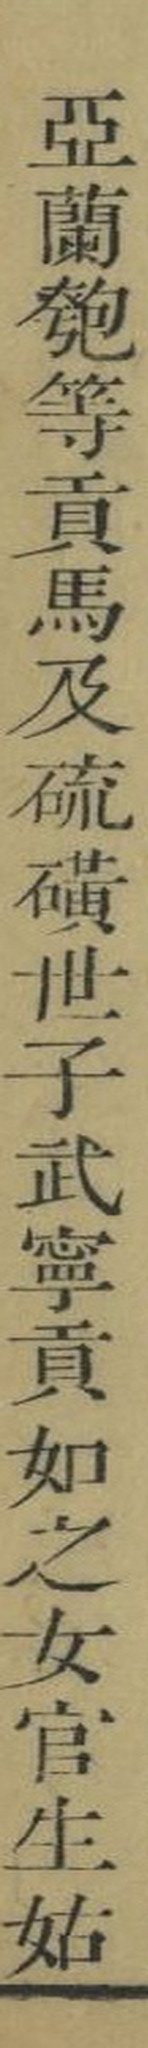亜蘭匏等貢馬及硫磺世子武寧貢如之女官生姑

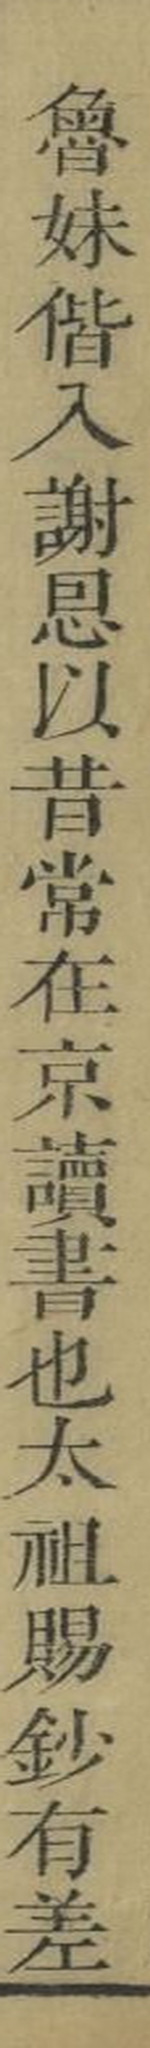魯妹偕入謝恩以昔常在京読書也太祖賜鈔有差
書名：中山伝信録 巻三
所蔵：University of the Ryukyus Library
